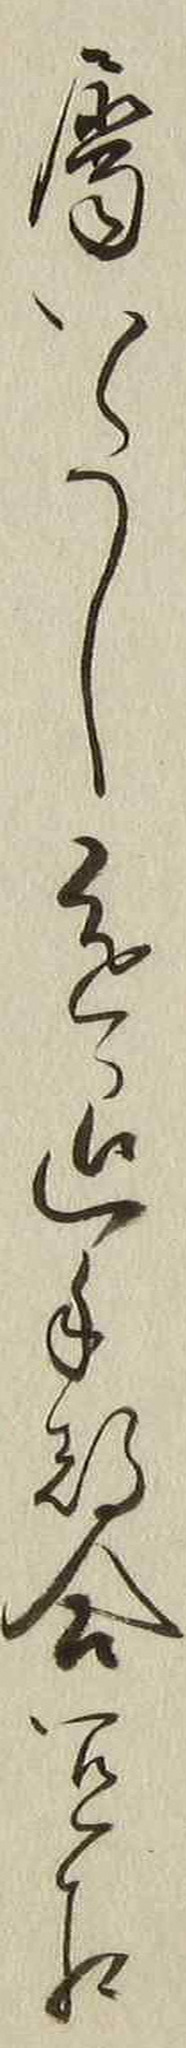属いたし進退手都合宜相
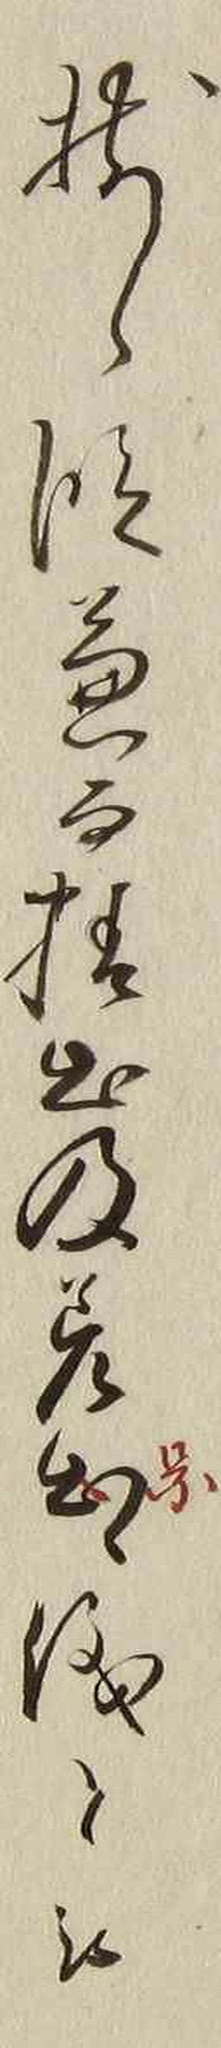揃候段兼而精出図候儀と被
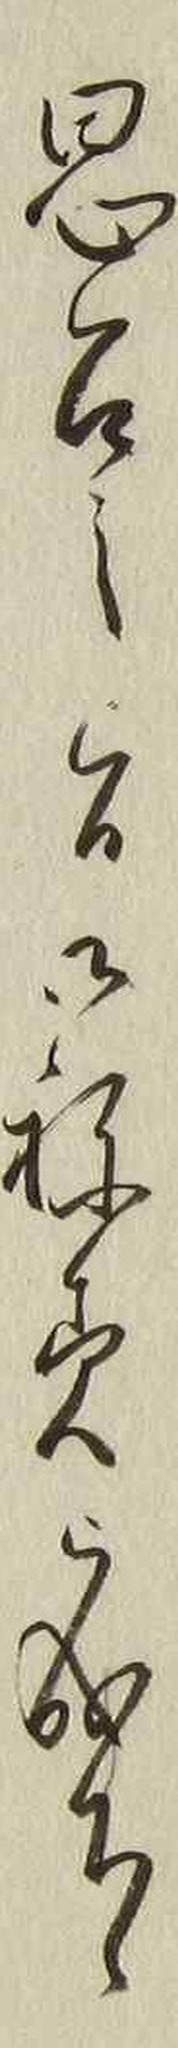思召之旨御称美被成下候
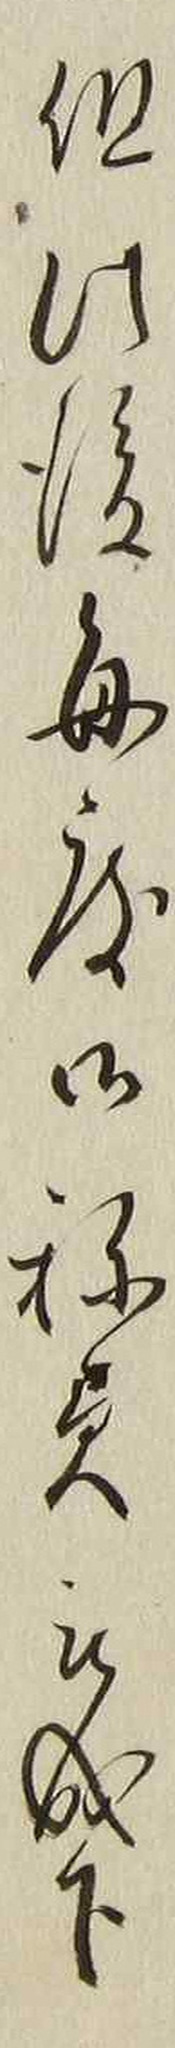但此後毎度御称美被成下
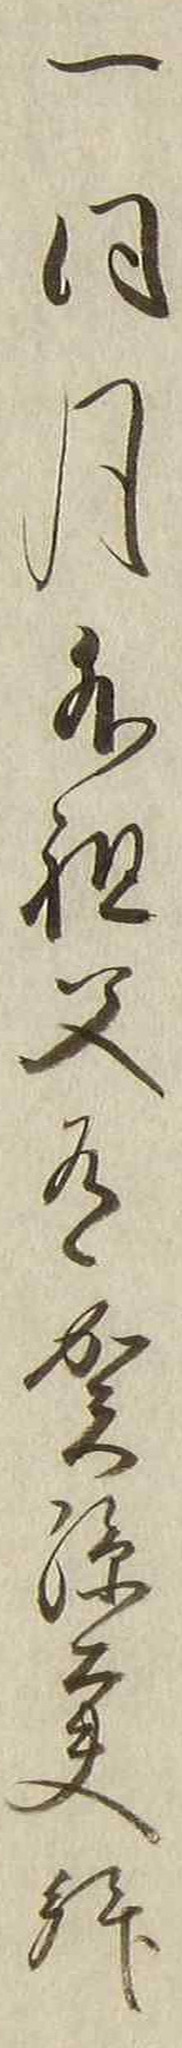一同月外祖父有賀孫大夫拝

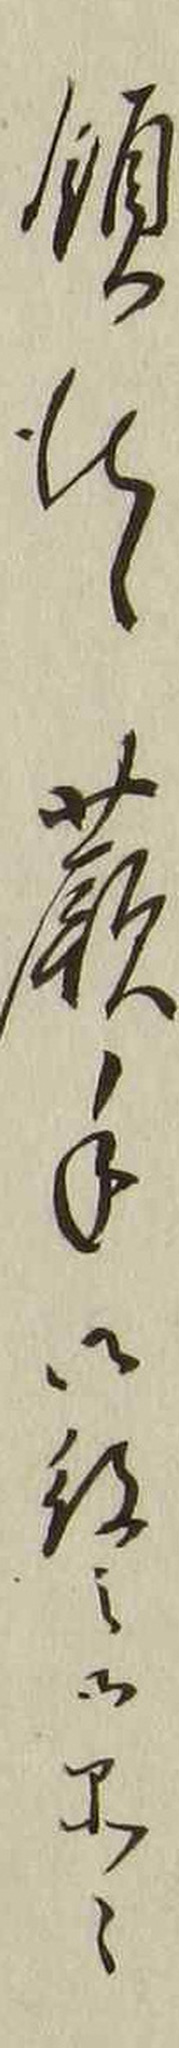領仕候蕨手御紋之御品々
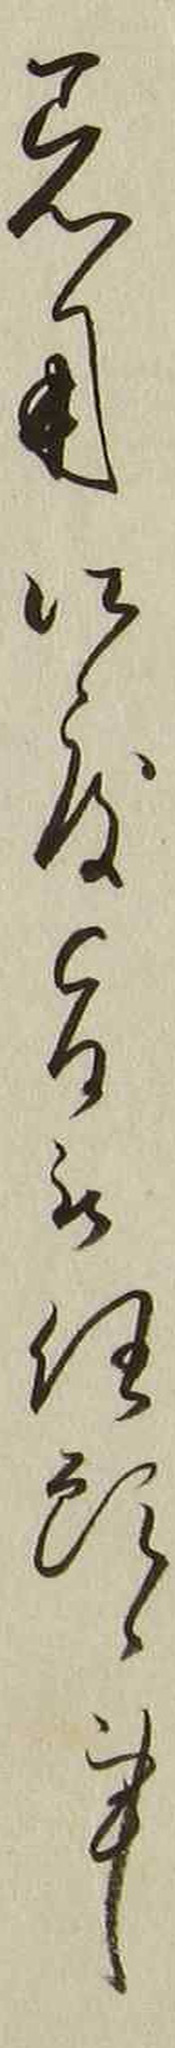着用仕度旨被任願候事
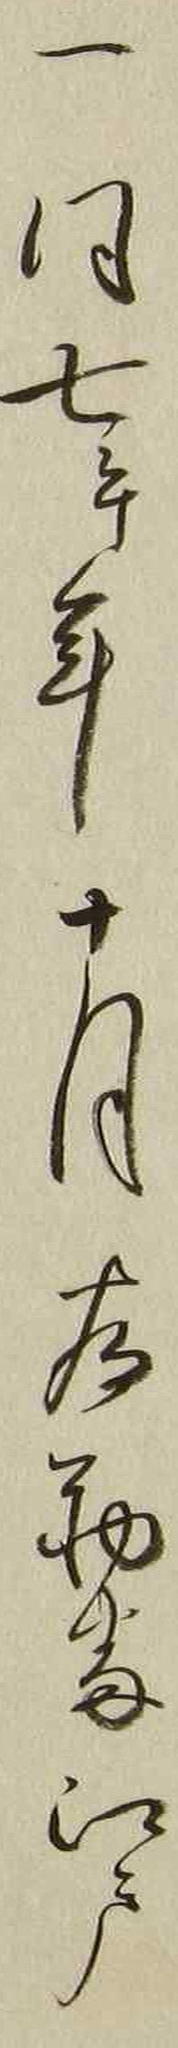一同七午年十月為御勤番江戸
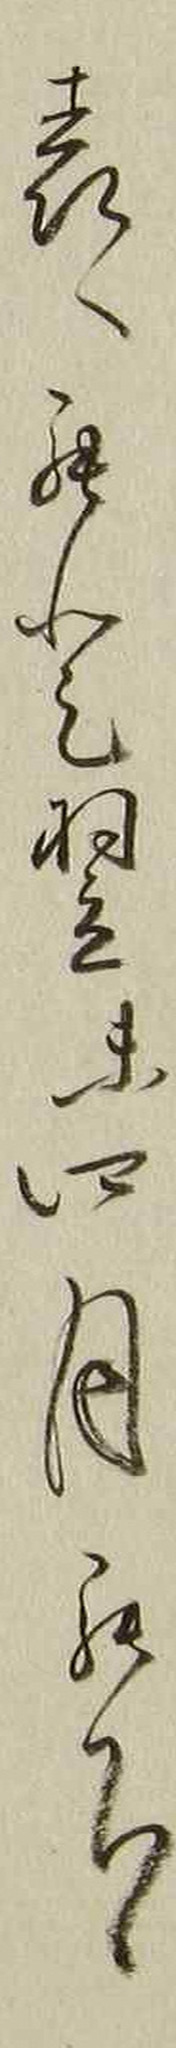表へ罷登翌未四月被下候
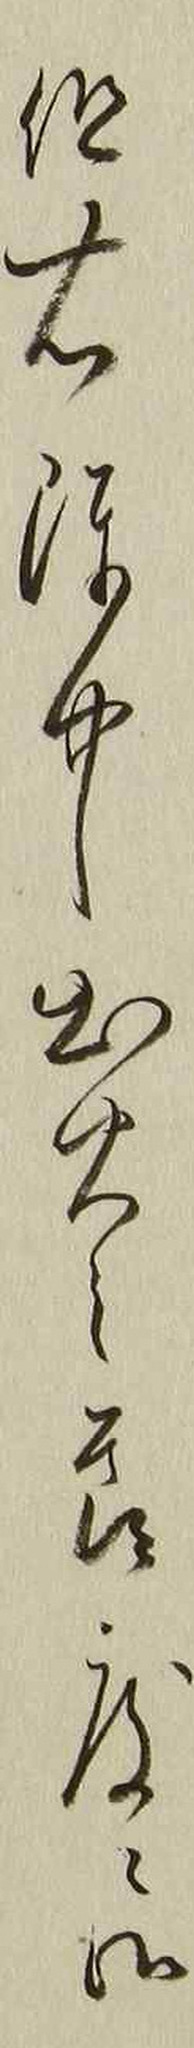但右陣中出火之節度々御
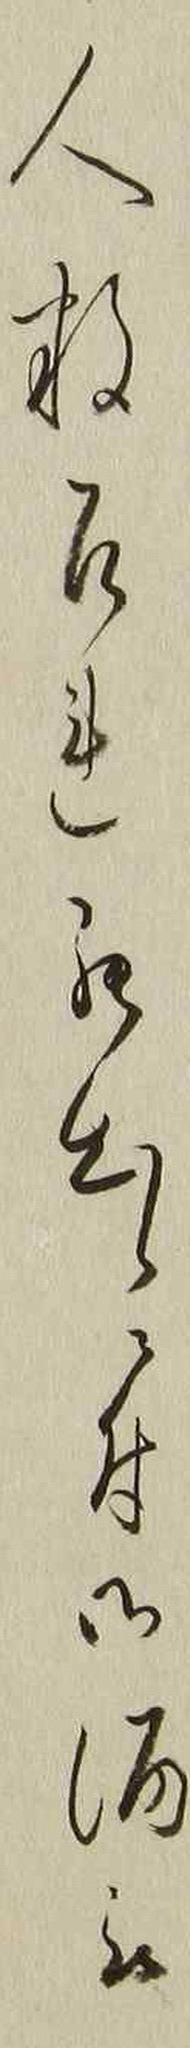人数召連罷出候ニ付御酒被
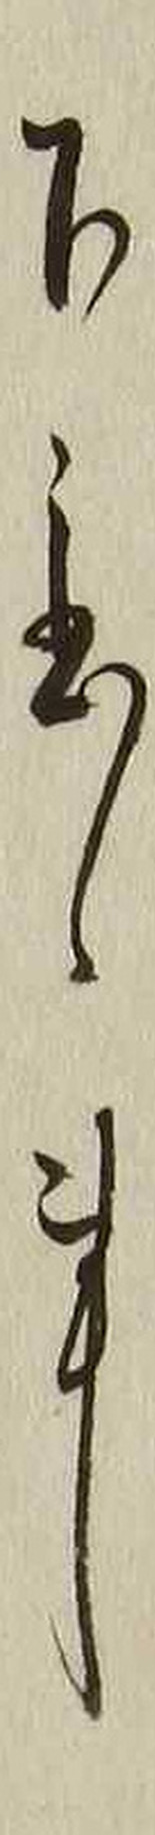下置候事
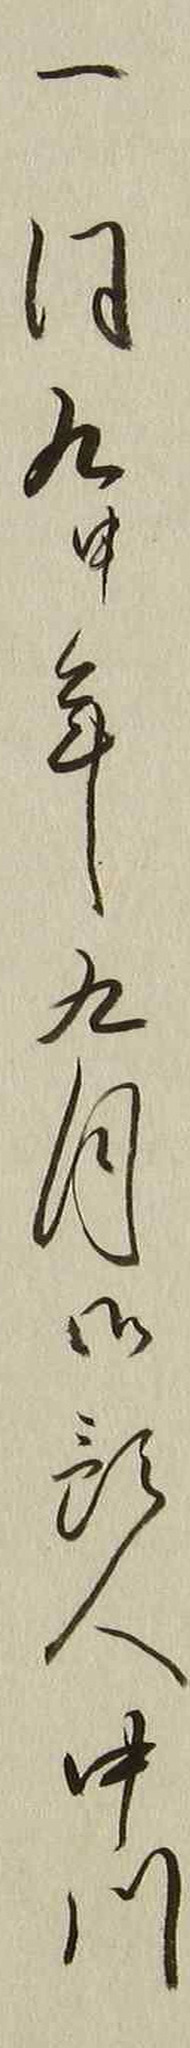一同九申年九月御預人中川
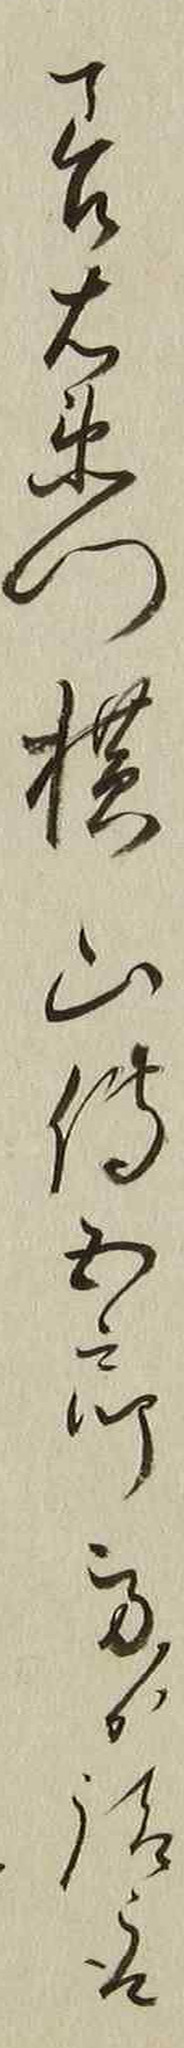善右衛門横山伝五郎方ゟ請取
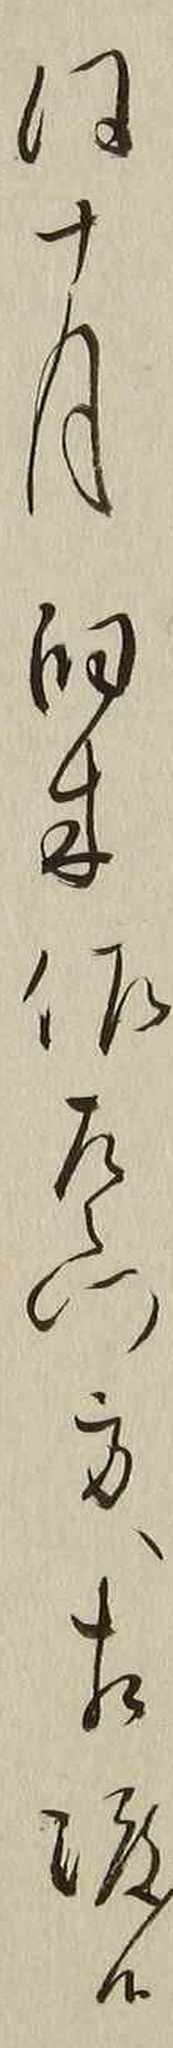同十月洞木作左衛門方へ相渡候
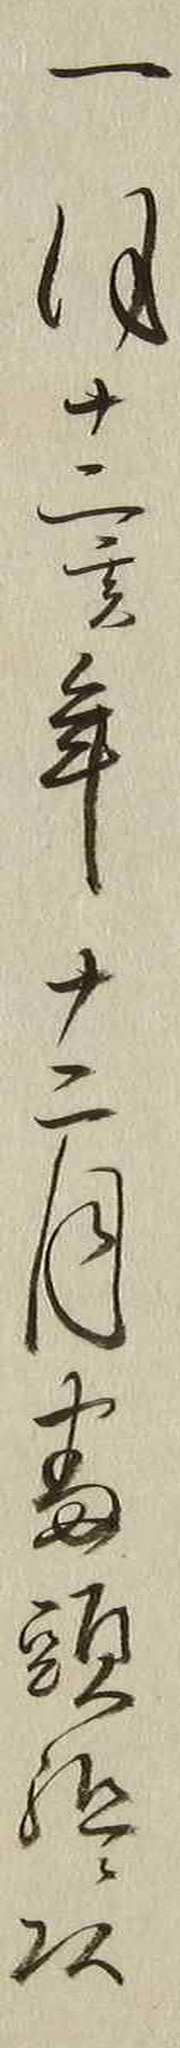一同十二亥年十二月番頭組ニ頭
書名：諸士系譜　巻之18　い之部18
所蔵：会津若松市立会津図書館
